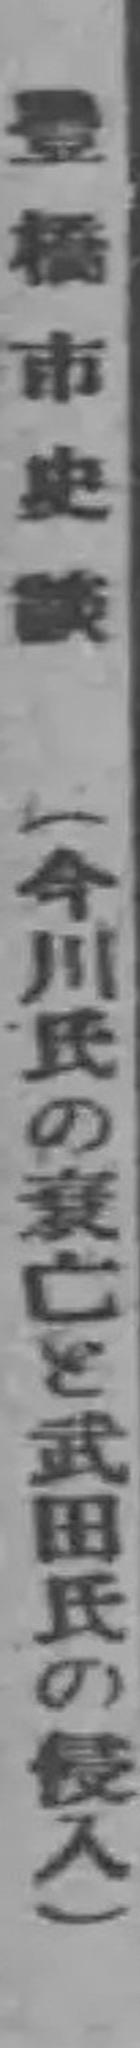豊橋市史談

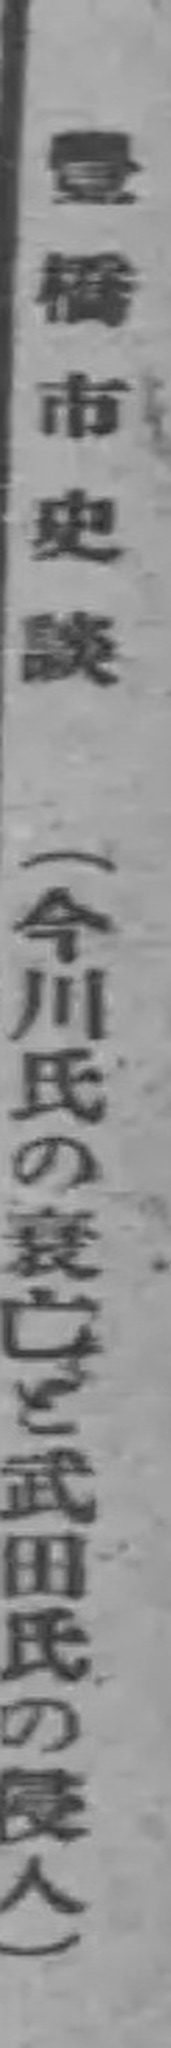豊橋市史談(今川氏の衰亡と武田氏の侵入)百八
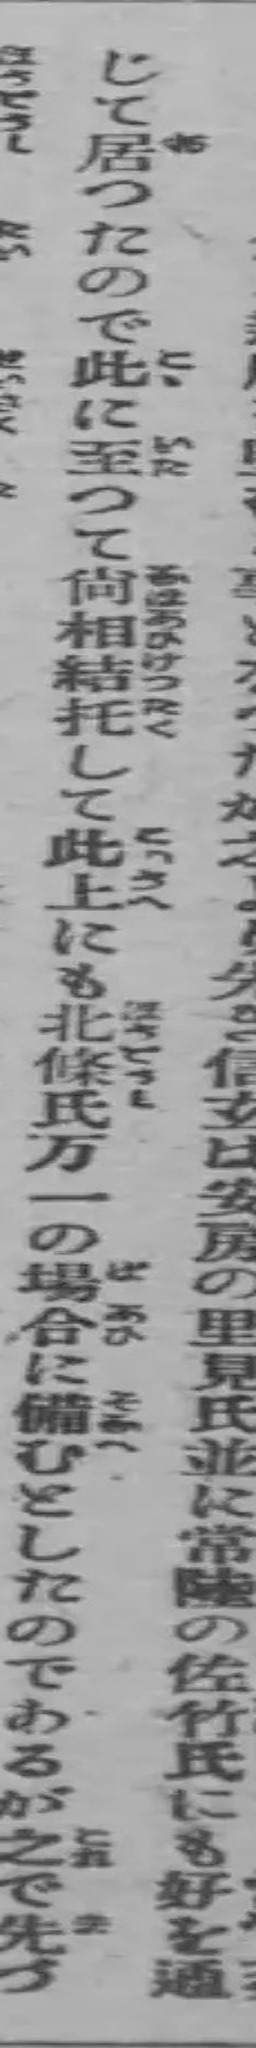じて居つたので此に至つて尚相結托して此上にも北条氏万一の場合に備むとしたのであるが之で先づ
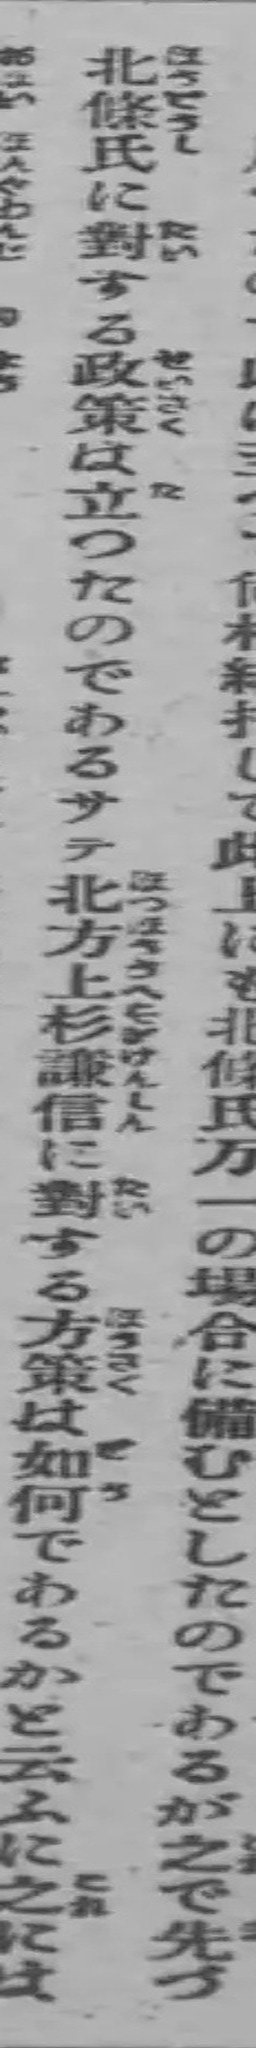北条氏に対する政策は立つたのであるサテ北方上杉謙信に対する方策は如何であるかと云ふに之には
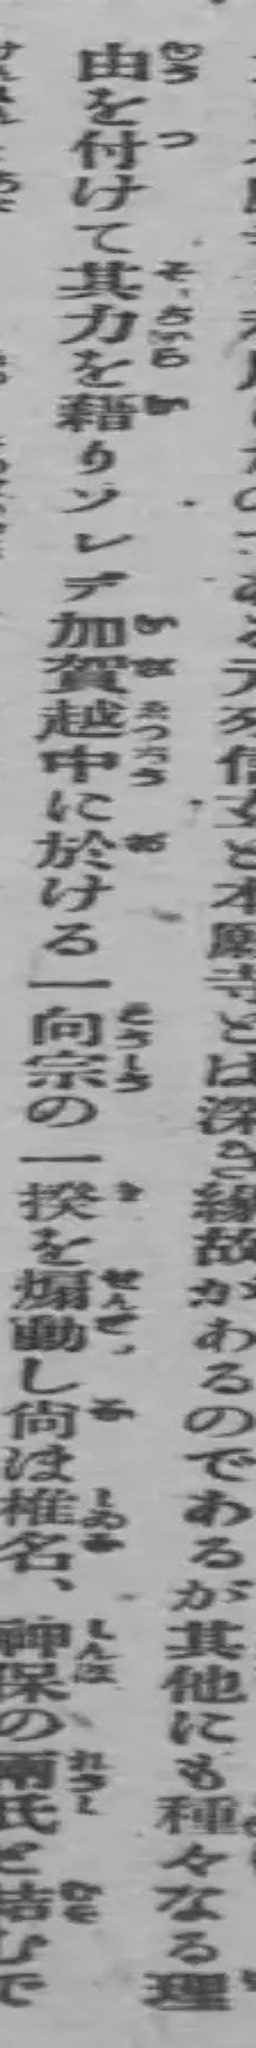由を付けて其力を藉りソレデ加賀越中に於ける一向宗の一揆を煽動し尚ほ椎名、神保の両氏と結むで
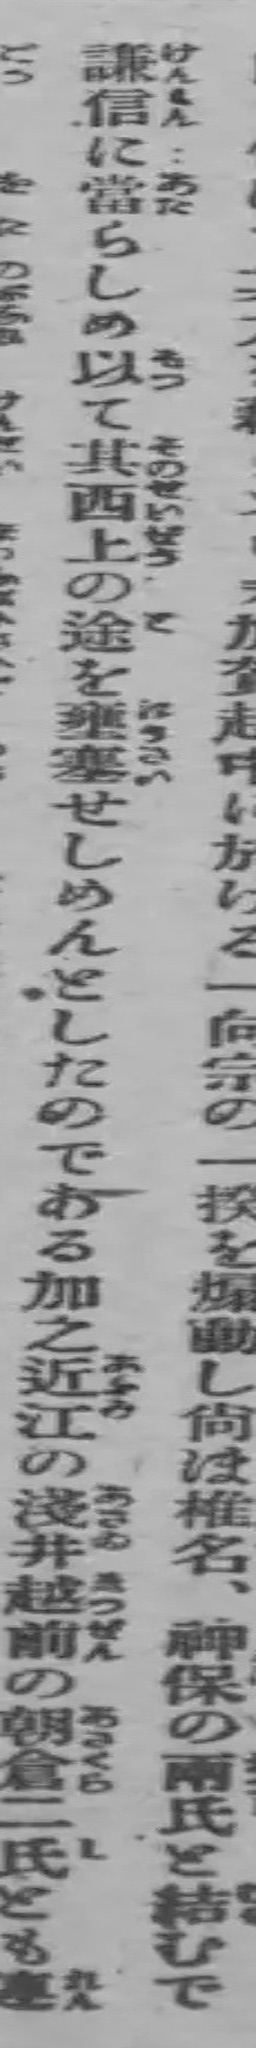謙信に当らしめ以て其西上の途を壅塞せしめんとしたのである加之近江の浅井越前の朝倉二氏とも連
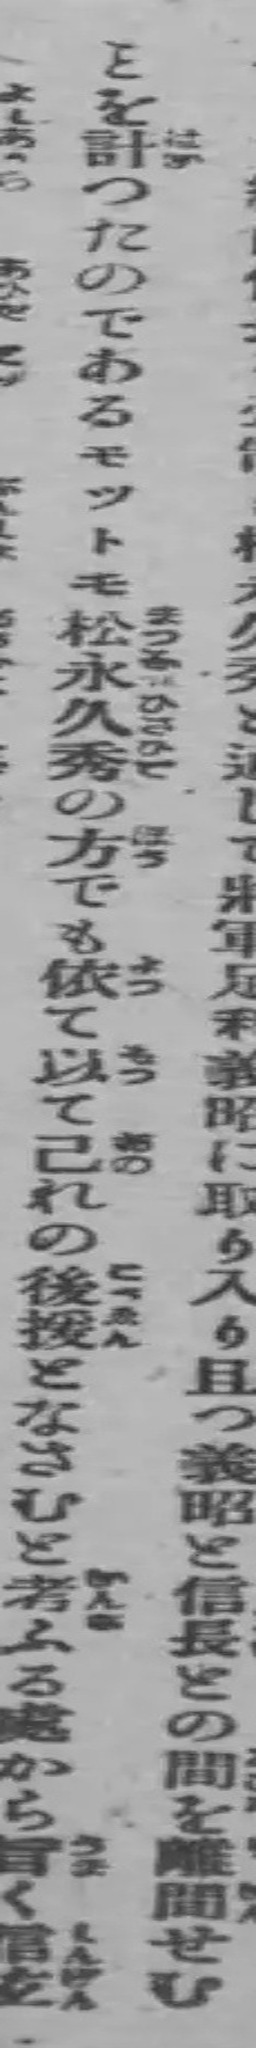ことを計つたのであるモツトモ松永久秀の方でも依て以て己れの後援となさむと考ふる処から旨く信玄
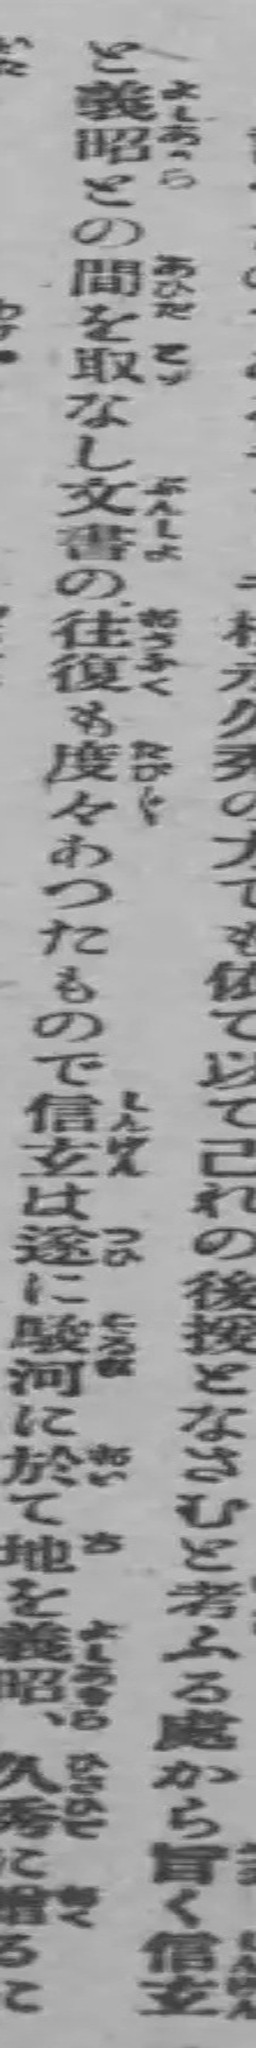と義昭との間を取なし文書の往復も度々あつたもので信玄は遂に駿河に於て地を義昭、久秀に贈るに
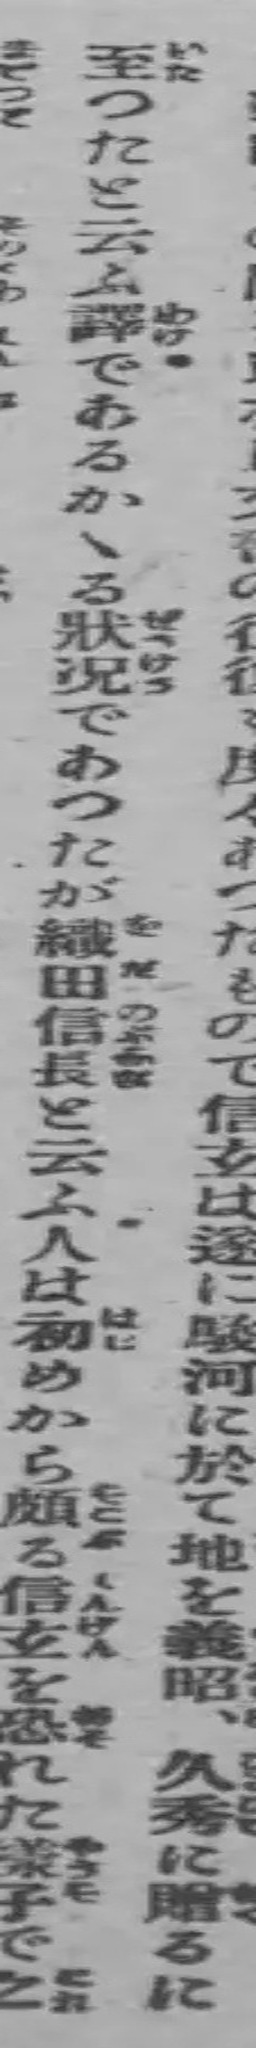至つたと云ふ訳であるかゝる状況であつたが織田信長と云ふ人は初めから頗る信玄を恐れた様子で之
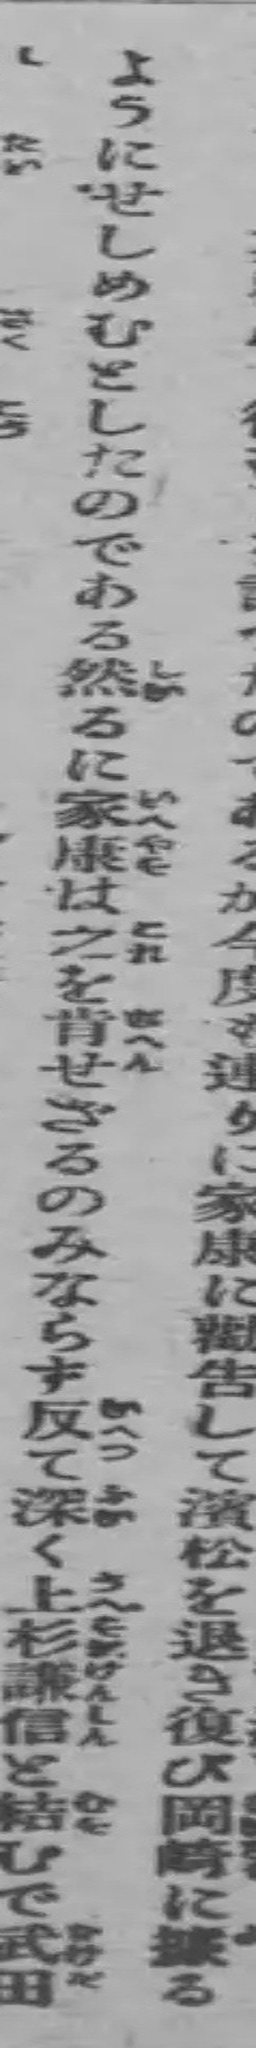合ようにせしめむとしたのである然るに家康は之を肯せざるのみならず反て深く上杉謙信とむ結むで武田
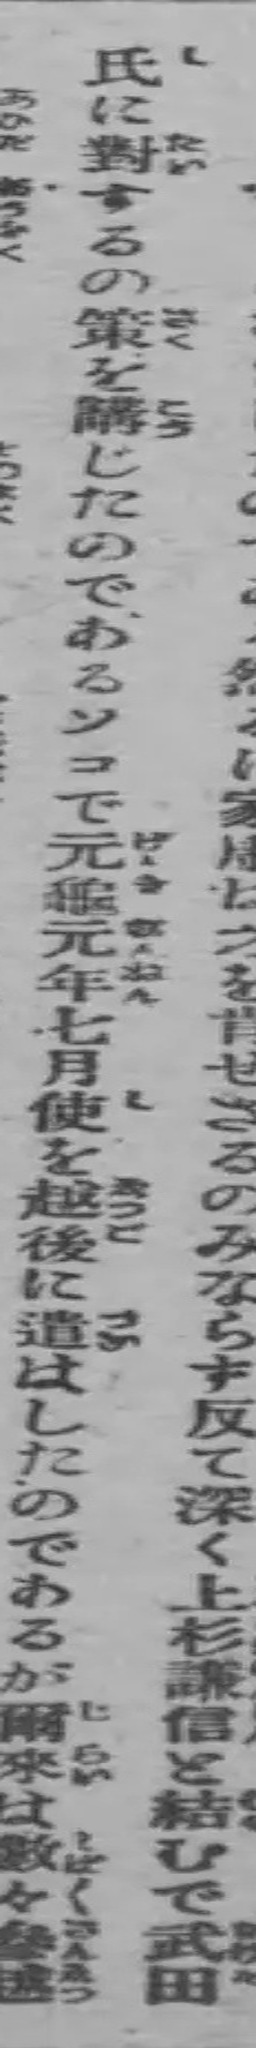氏に対する策を講じたのであるソコで元亀元年七月使を越後に遣はしたのであるが爾来は数々参越
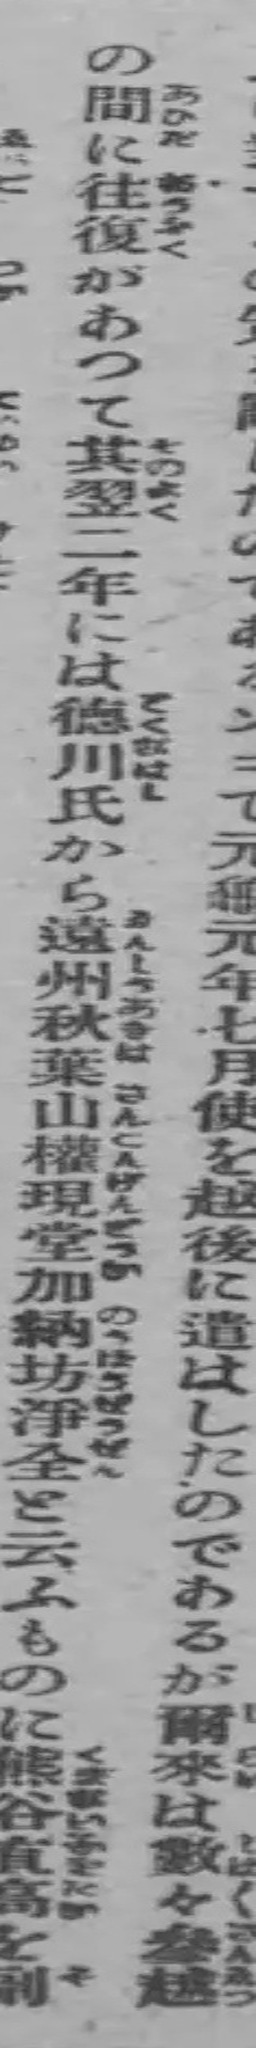の間に往復があつて其翌二年には徳川氏から遠州秋葉山権現堂加納坊浄全と云ふものに熊谷直高を副
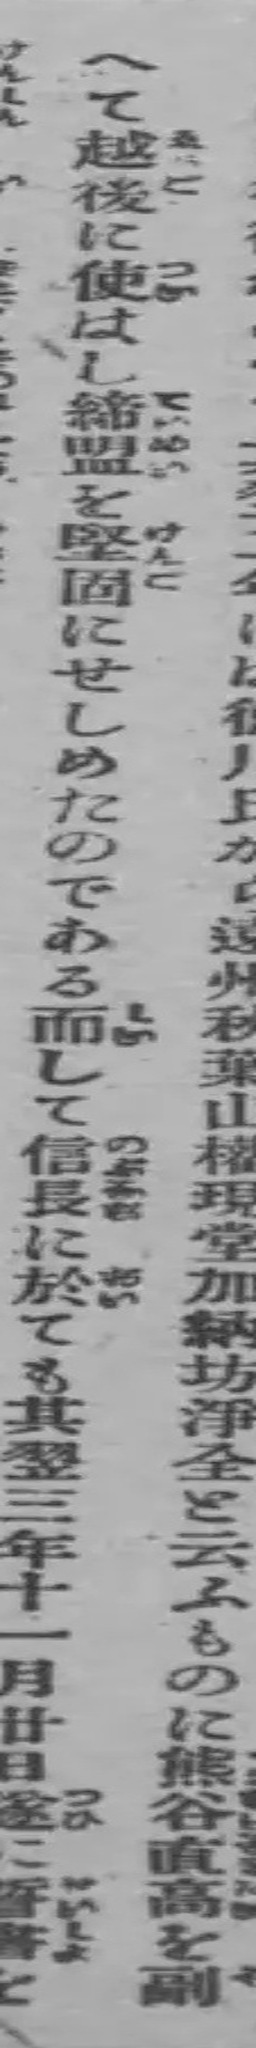へて越後に使はし締盟を堅固にせしめたのである而して信長に於ても其翌三年十一月廿日遂に誓書を
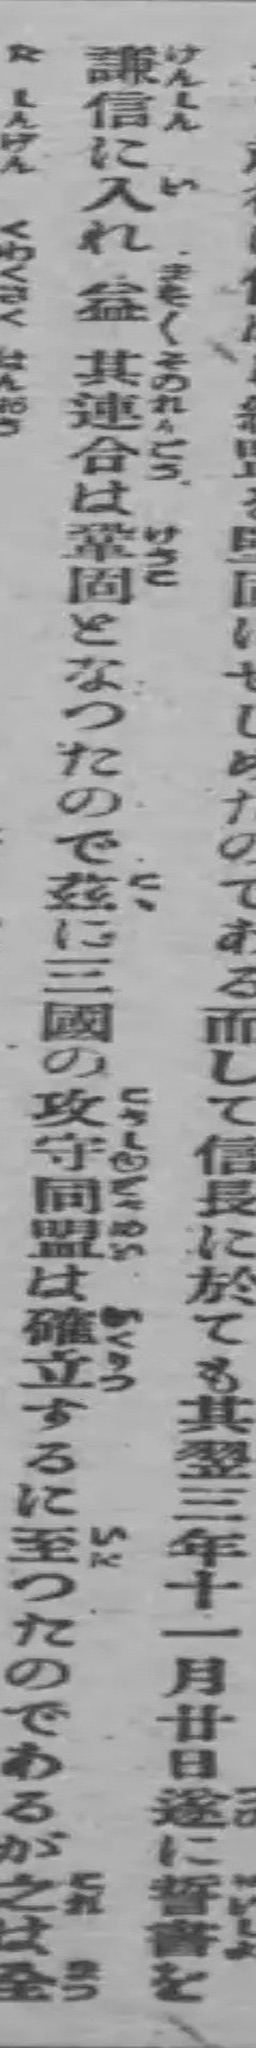謙信に入れ益其連合は鞏固となつたので茲に三国の攻守同盟は確立するに至つたのであるが之は全
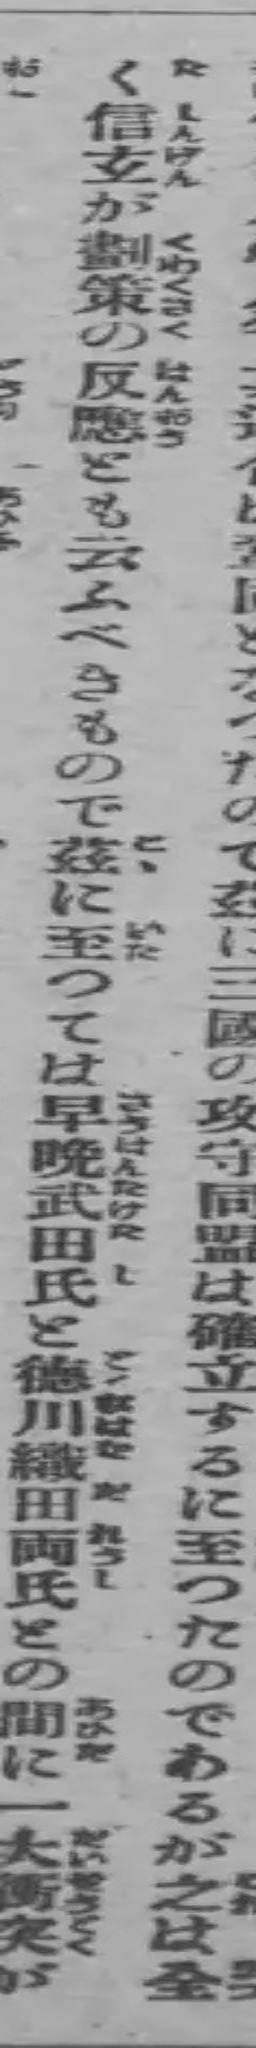く信玄が劃割策の反応とも云ふべきもので茲に至つては早晩武田氏と徳川織田両氏との間に一大衝突が
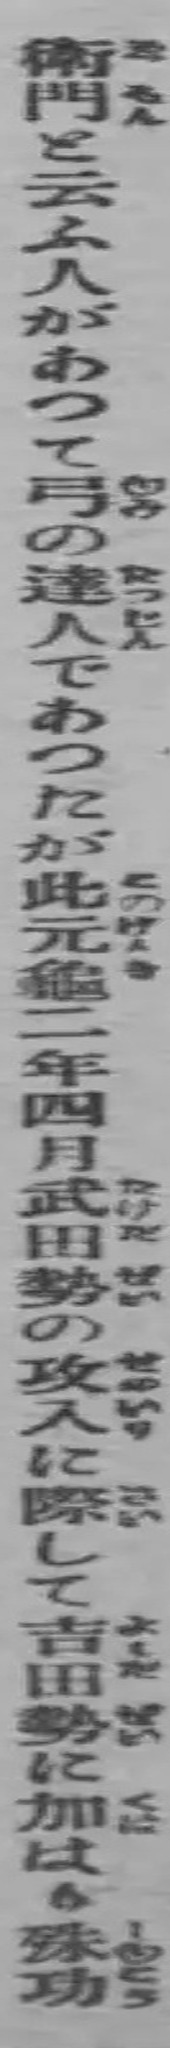衛門と云ふ人があつて弓の達人であつたが此元亀二年四月武田勢の攻入に際して吉田勢に加はり殊功
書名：豊橋市史談
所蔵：国立国会図書館 National Diet Library, JAPAN
